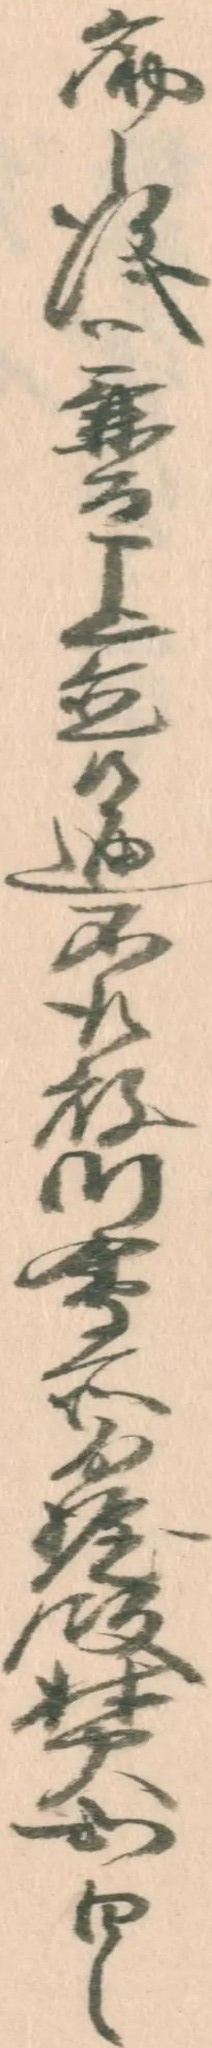筋之儀ハ兼て申上置候通不取敢御会所ゟ握飯焚出日〻
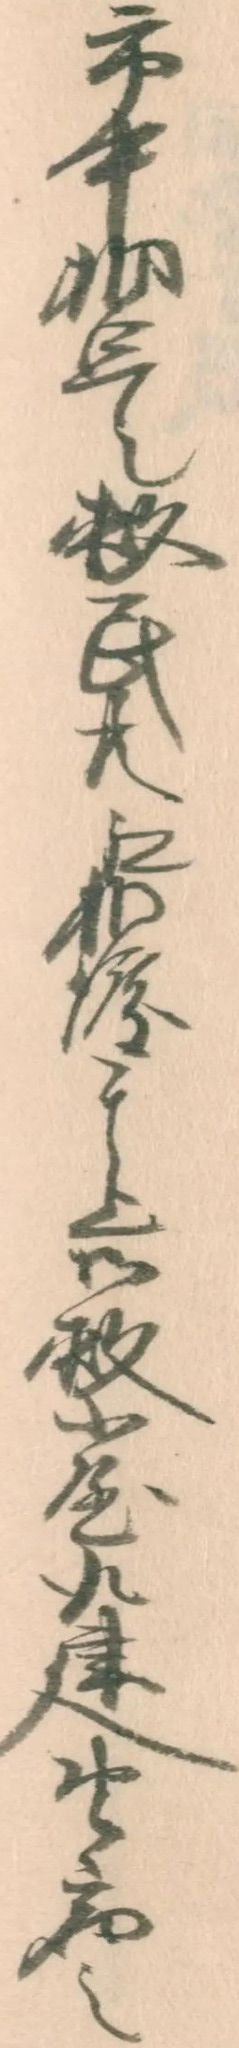市中拝廻之救民共え相渡其上御救小屋取建野宿之
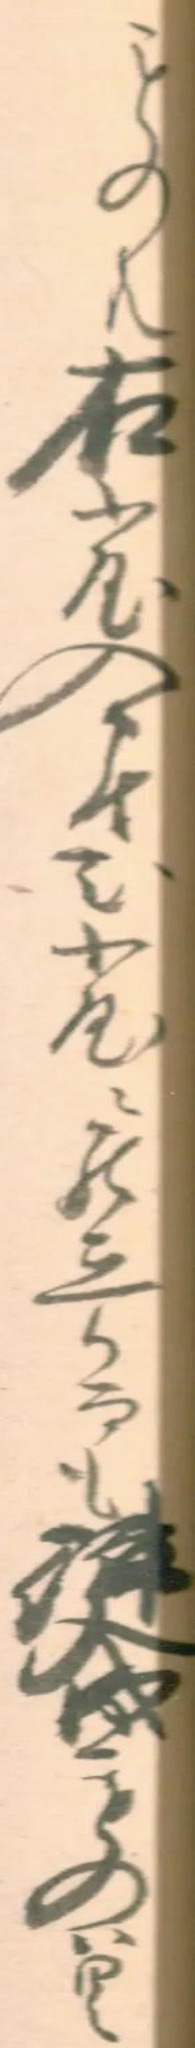もの共右小屋入申付尤小屋ニ罷在りても隣合ものハ日〻
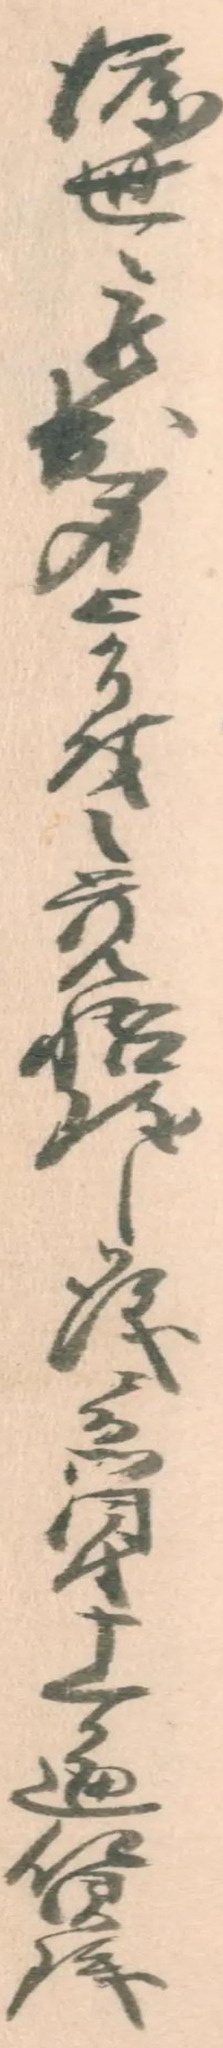渡世へ罷出身上有付之覚悟致し候儀ニて御目付申上候通賃銭
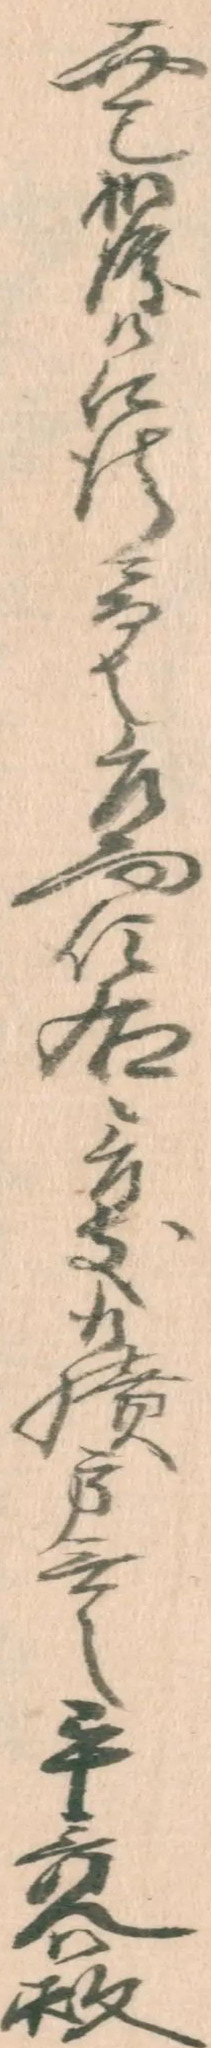而已相渡候仕付ニては差向住居ニ差支取続方無之畢竟御救
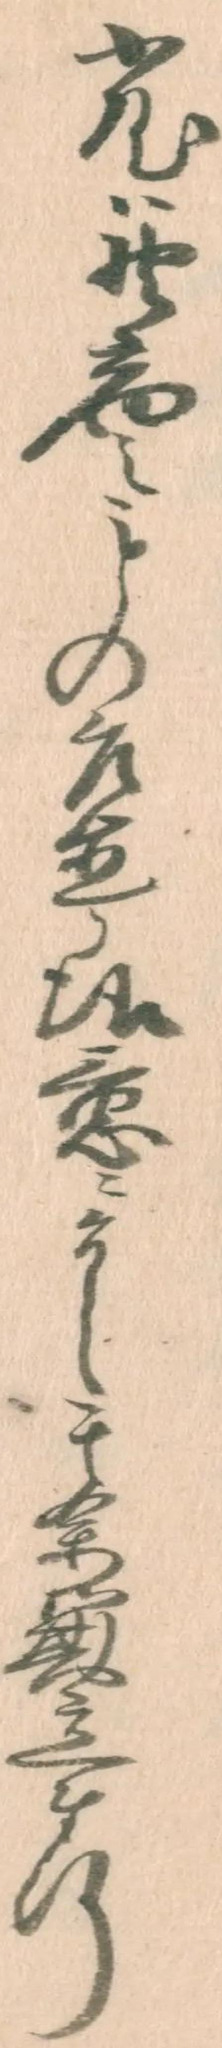小屋ハ野宿之もの差置候趣意ニ有之其余御勘定奉行
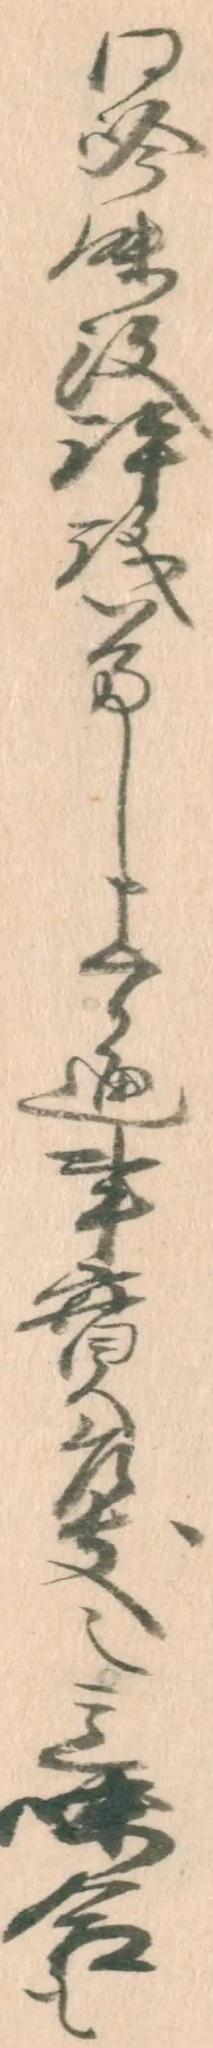同吟味役評議いたし申上候通事実差支之意味合も
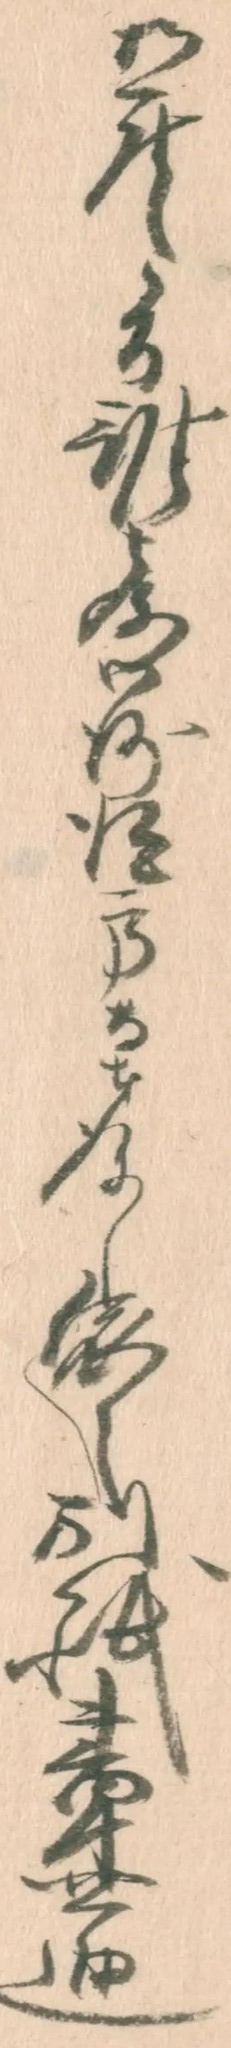御座候間難被及御沙汰方と奉存候依之別紙書付弐通
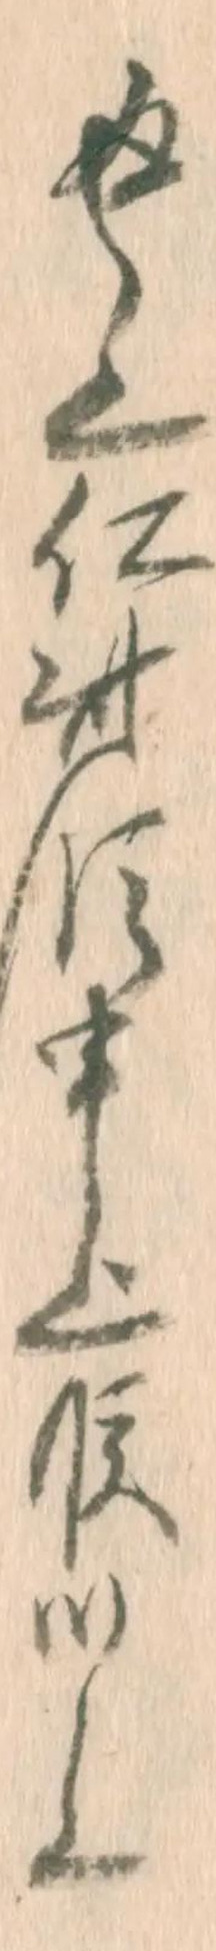返上仕此段申上候以上
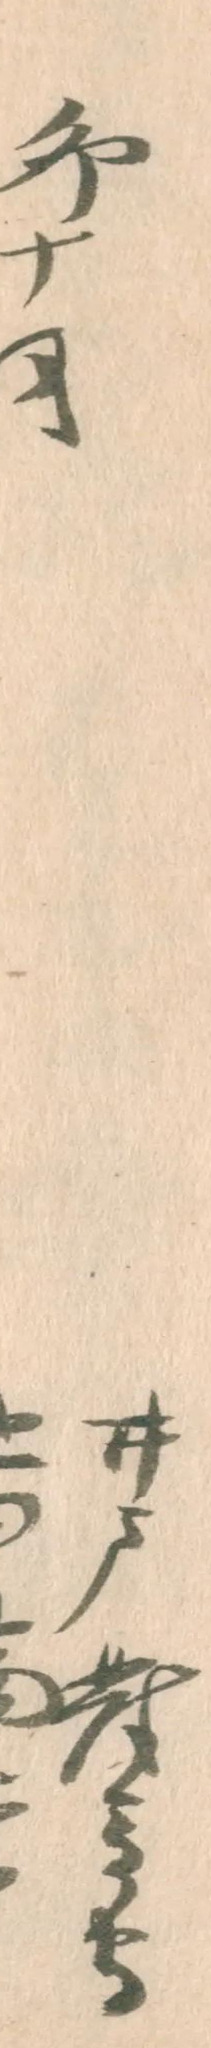卯十月井戸対馬守

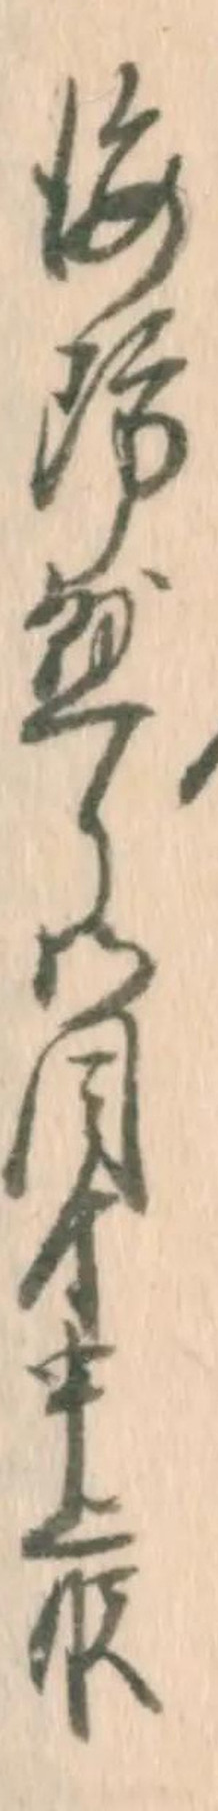│海防懸り御目付申上候
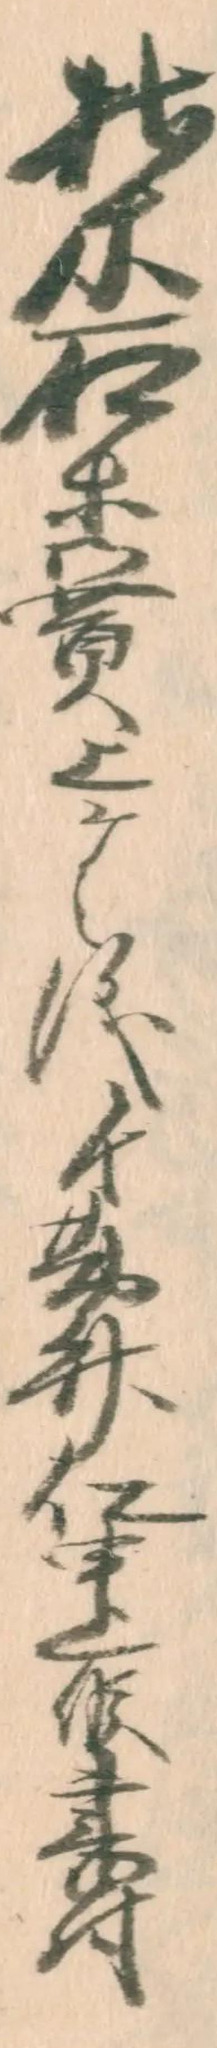│材木石等御買上ケ之儀ニ付勘弁仕申上候書付
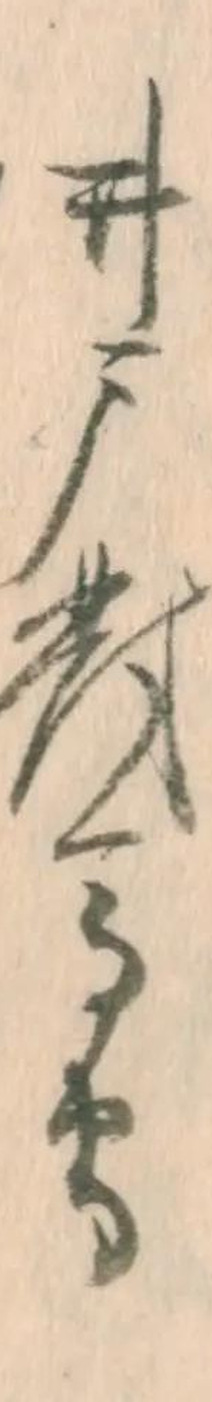│井戸対馬守
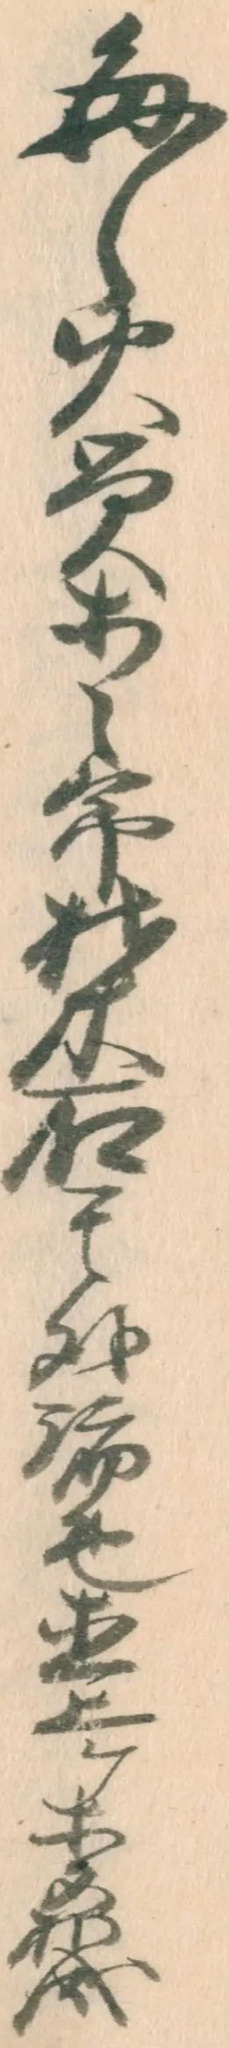毎〻火災等之節材木石其外諸色直上ケ等不相成
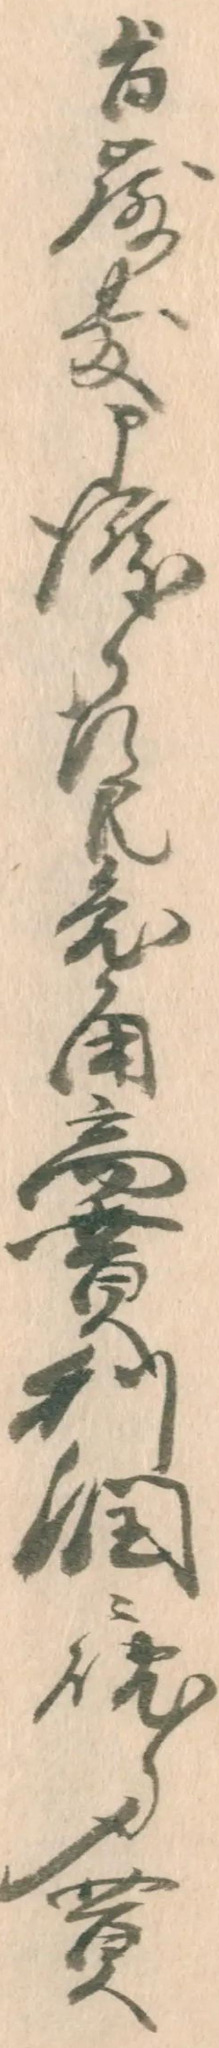旨厳敷申渡候得共兎角商売利潤ニ耽り〆買

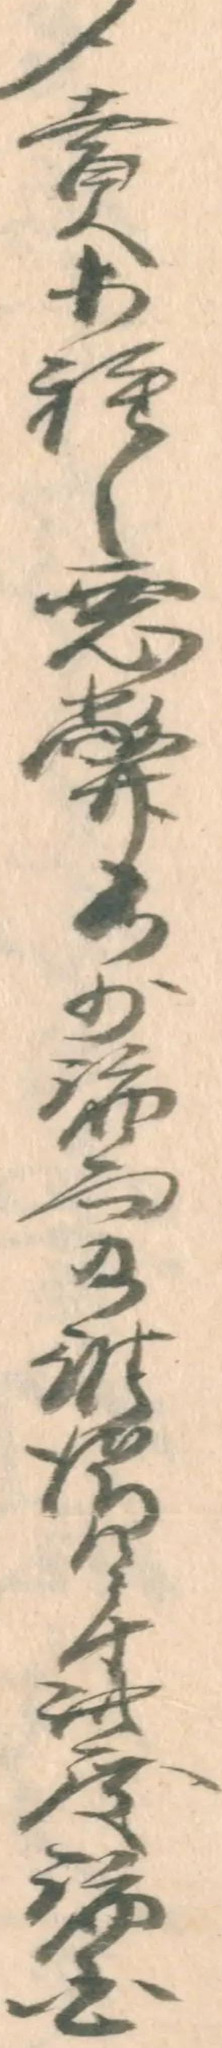〆売等種〻悪弊不少諸向及難渋候ニ付此度諸国
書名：地震災書留 2巻. [2] 内表紙に「地震一件　安政二卯年十月」とあり
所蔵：国立国会図書館 National Diet Library, JAPAN
